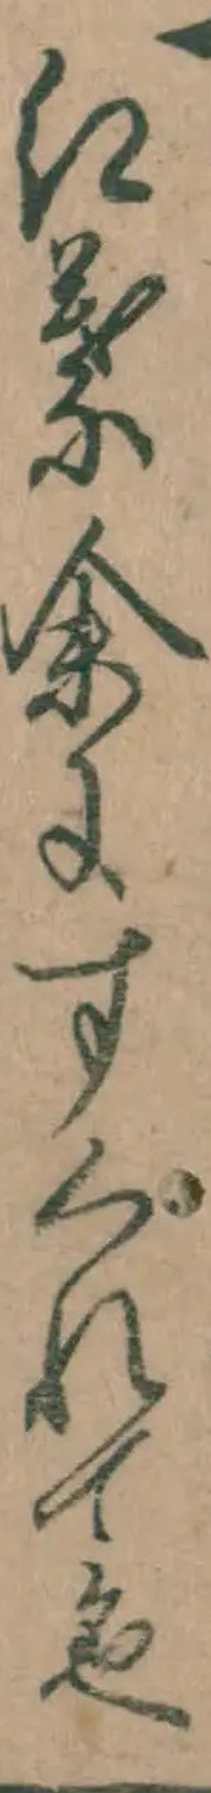紅葉余にすくれて色
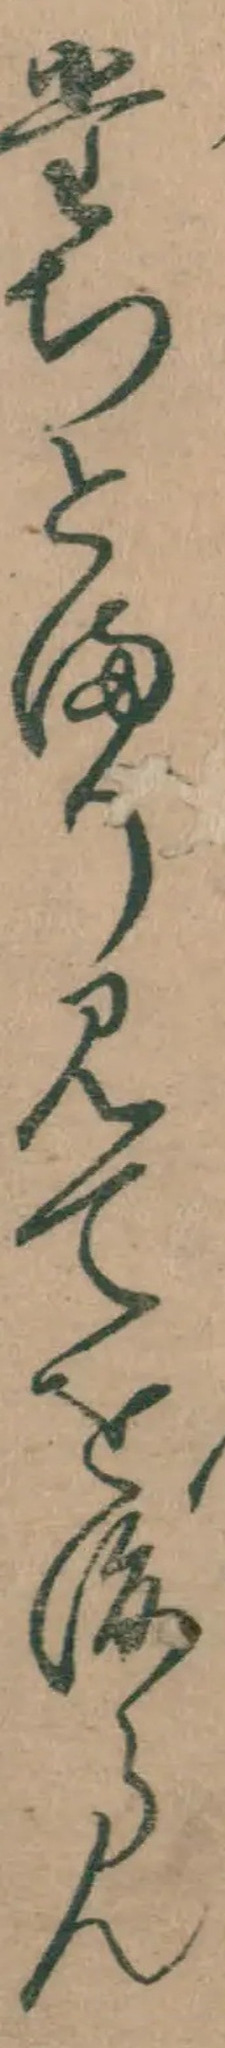たちとまり見てを渡らん
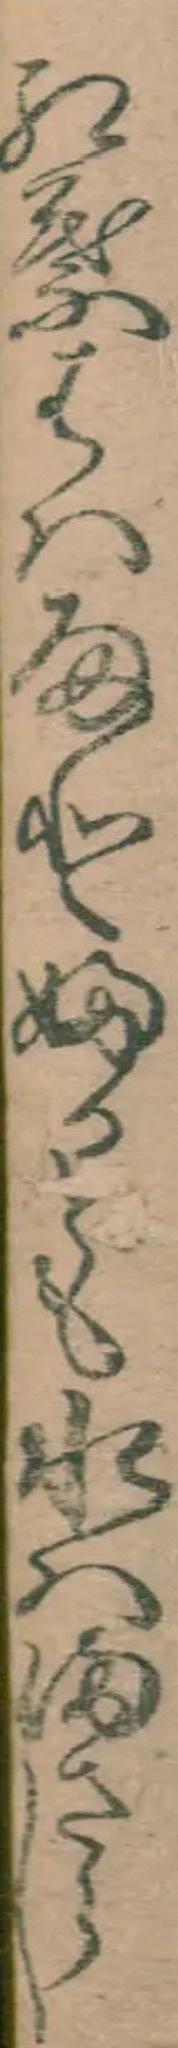紅葉はは雨とふるとも水はまさら
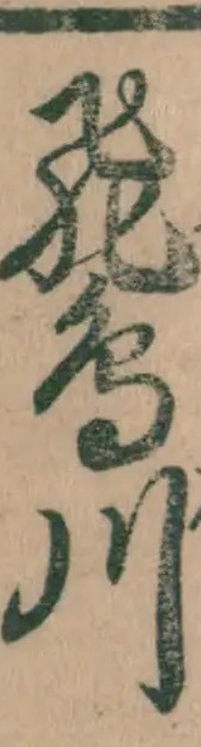飛鳥川
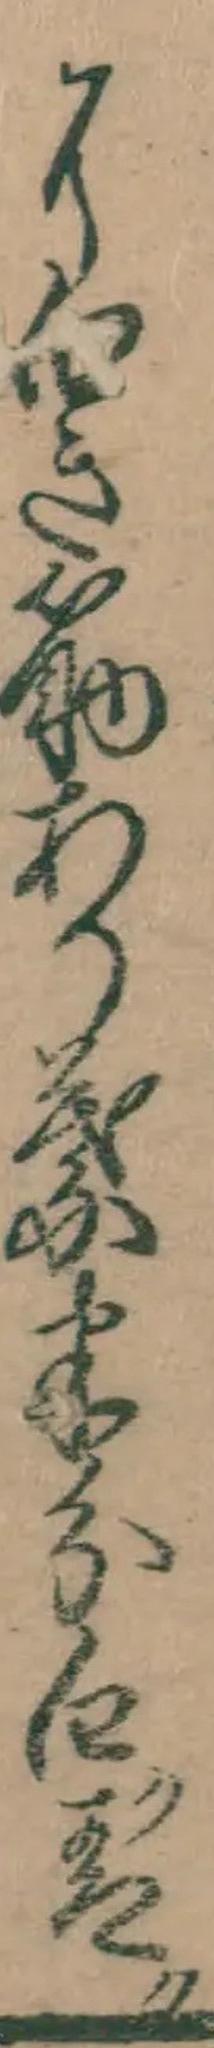に白き筋あり葉半分白青
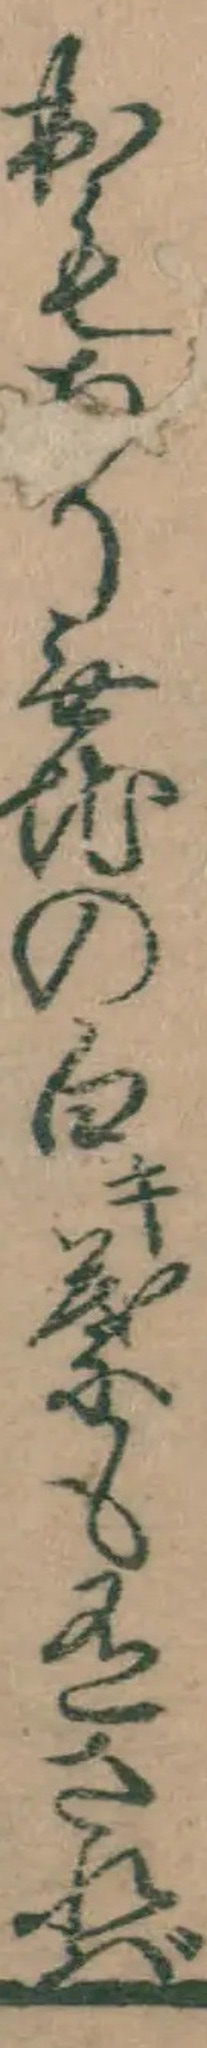出もあり無地の白葉も有されば
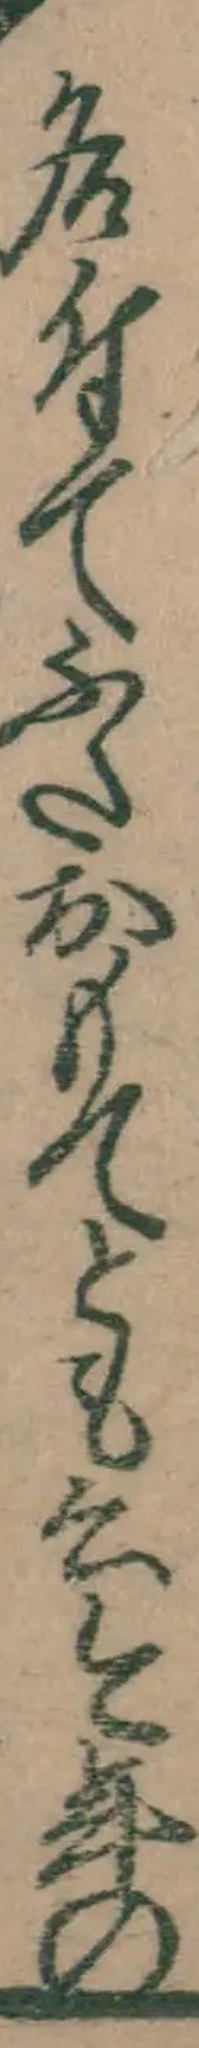人麿名付てふたおもてとも云今年の
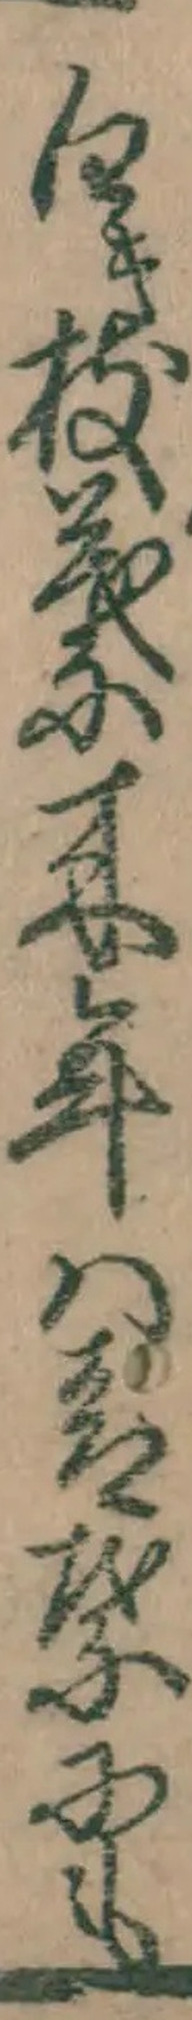白枝葉来年は青葉にも
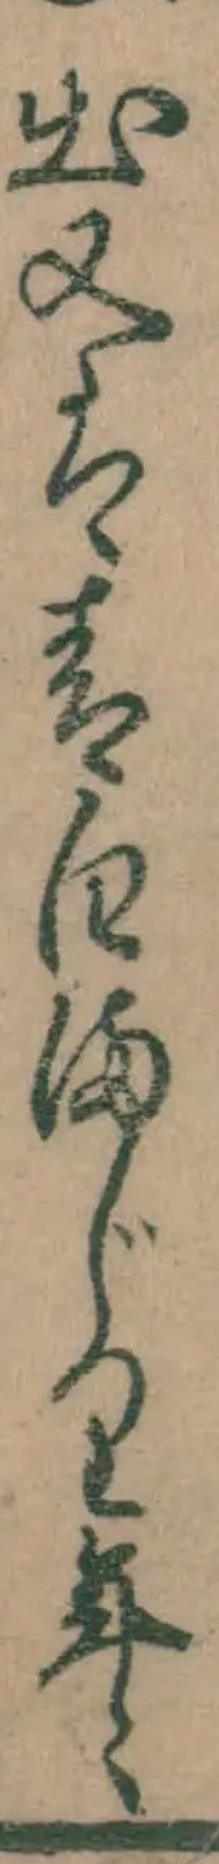出又は青白まじり年々
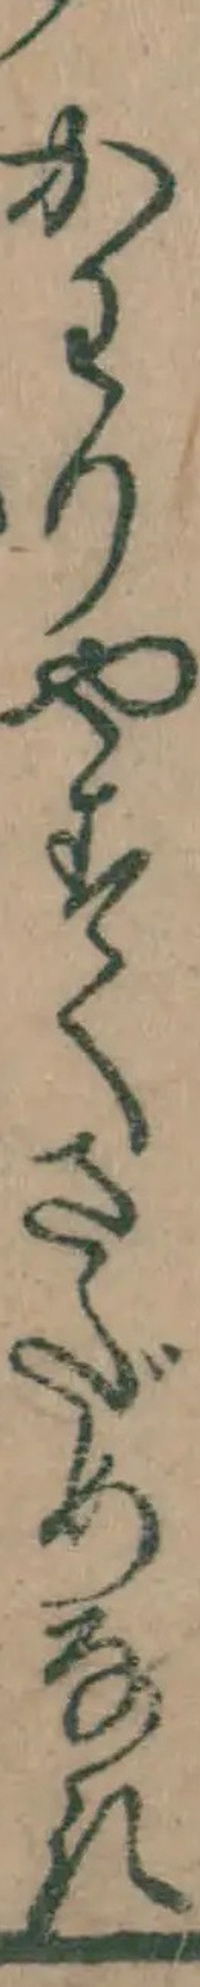かわりやすくさだめなる
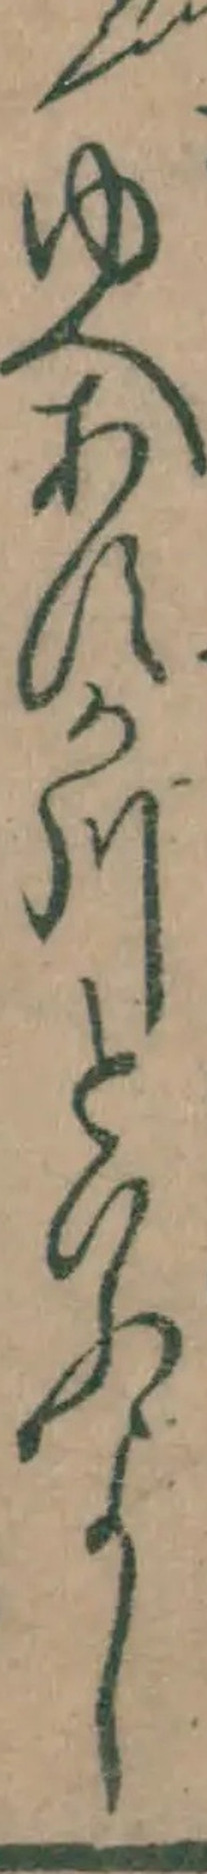ゆへあすか川といふよし
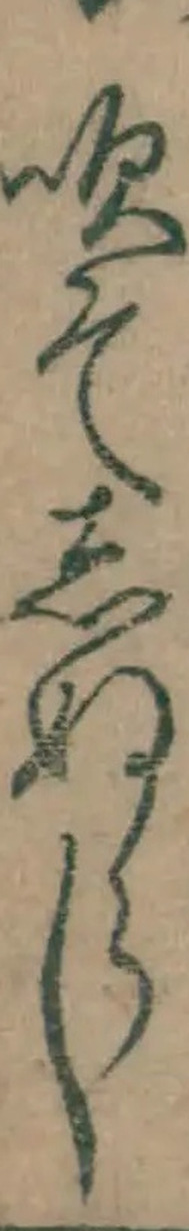吹そしぬら

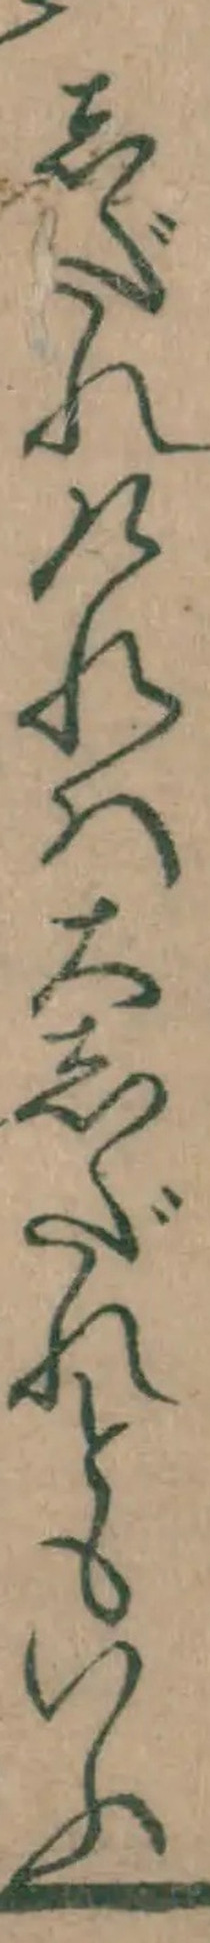しだれけれは大しだれともいふ
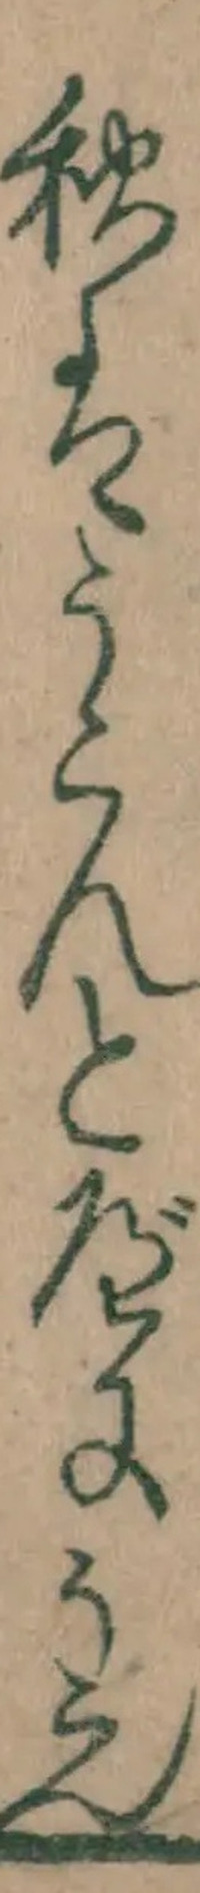秋はうこんとべにうこん
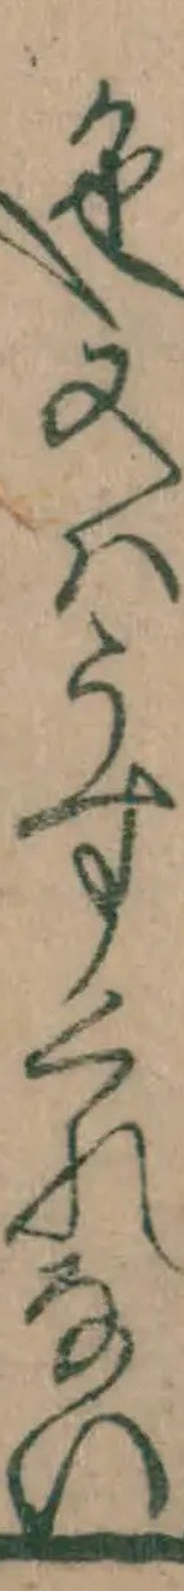色又はうすくれない
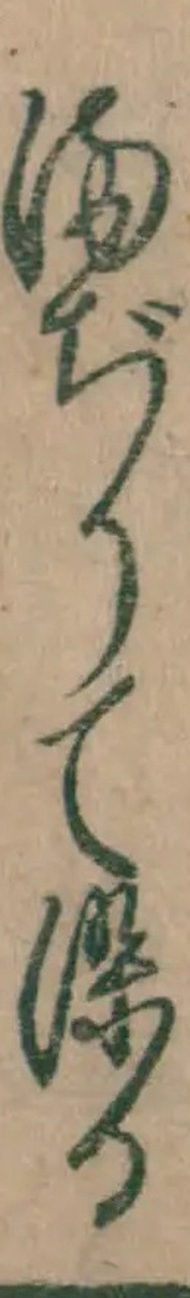まぢりて染る
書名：紅葉集
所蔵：国立国会図書館 National Diet Library, JAPAN
